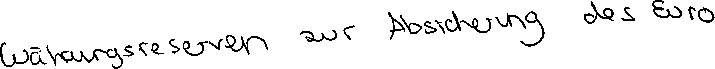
Währungsreserven zur Absicherung des Euro
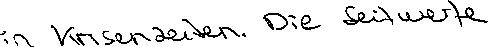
in Krisenzeiten. Die Leitwerte
